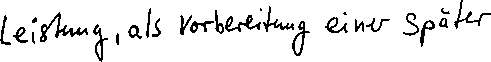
Leistung, als Vorbereitung einer später
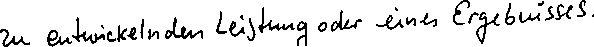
zu entwickelnden Leistung oder eines Ergebnisses.
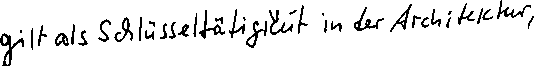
gilt als Schlüsseltätigkeit in der Architektur,
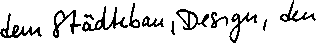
dem Städtebau, Design, den
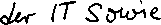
der IT sowie
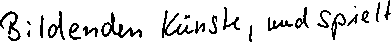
Bildenden Künste, und spielt
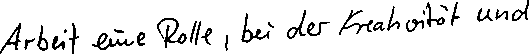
Arbeit eine Rolle, bei der Kreativität und
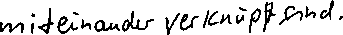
miteinander verknüpft sind.
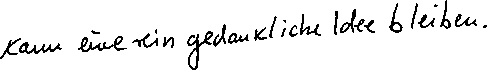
kann eine rein gedankliche Idee bleiben.
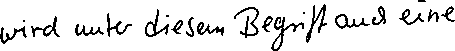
wird unter diesem Begriff auch eine
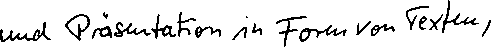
und Präsentation in Form von Texten,
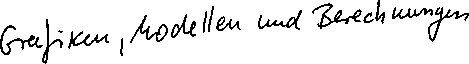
Grafiken, Modellen und Berechnungen
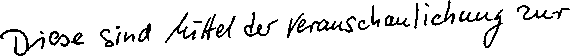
Diese sind Mittel der Veranschaulichung zur
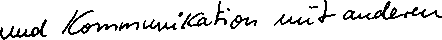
nd Kommunikation mit anderen
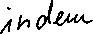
indem
